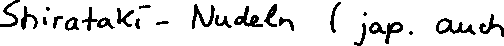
Shirataki-Nudeln (jap. auch
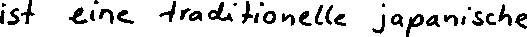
ist eine traditionelle japanische
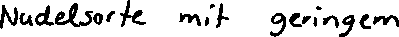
Nudelsorte mit geringem
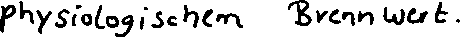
physiologischem Brennwert.
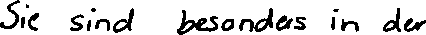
Sie sind besonders in der
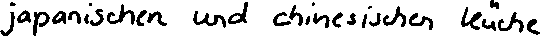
japanischen und chinesischen Küche
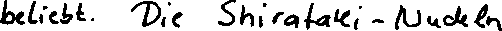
beliebt. Die Shirataki-Nudeln
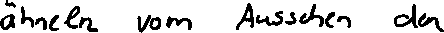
ähneln vom Aussehen den
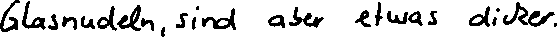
Glasnudeln, sind aber etwas dicker.
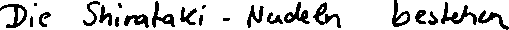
Die Shirataki-Nudeln bestehen
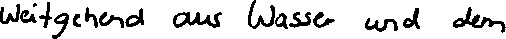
weitgehend aus Wasser und dem
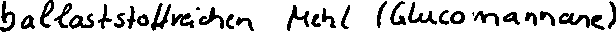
ballaststoffreichen Mehl (Glucomannane)
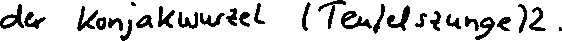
der Konjakwurzel (Teufelszunge)2.
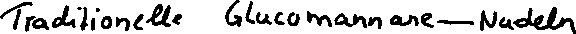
Traditionelle Glucomannane-Nudeln
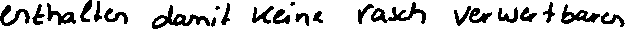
enthalten damit keine rasch verwertbaren
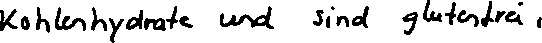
Kohlenhydrate und sind glutenfrei,
